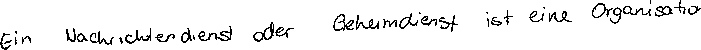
Ein Nachrichtendienst oder Geheimdienst ist eine Organisation
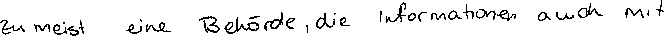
zumeist eine Behörde, die Informationen auch mit
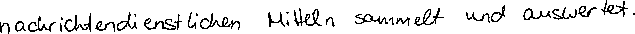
nachrichtendienstlichen Mitteln sammelt und auswertet.
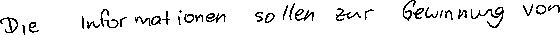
Die Informationen sollen zur Gewinnung von
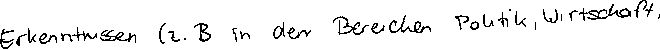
Erkenntnissen (z. B. in den Bereichen Politik, Wirtschaft,
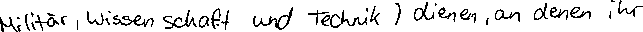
Militär, Wissenschaft und Technik) dienen, an denen ihr
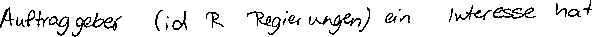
Auftraggeber (i. d. R. Regierungen) ein Interesse hat.
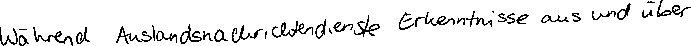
Während Auslandsnachrichtendienste Erkenntnisse aus und über
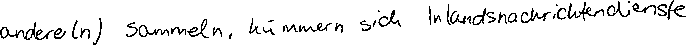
andere(n) Staaten sammeln, kümmern sich Inlandsnachrichtendienste
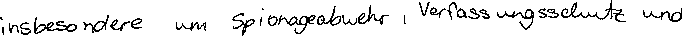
insbesondere um Spionageabwehr, Verfassungsschutz und
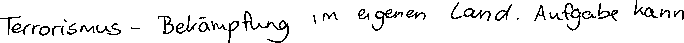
Terrorismus-Bekämpfung im eigenen Land. Aufgabe kann
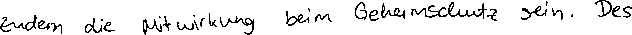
zudem die Mitwirkung beim Geheimschutz sein. Des
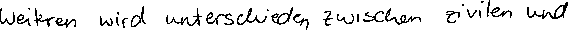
Weiteren wird unterschieden zwischen zivilen und
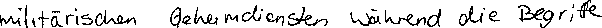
militärischen Geheimdiensten. Während die Begriffe
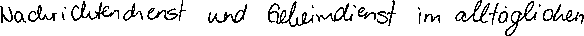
Nachrichtendienst und Geheimdienst im alltäglichen
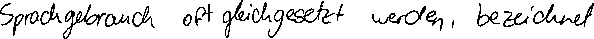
Sprachgebrauch oft gleichgesetzt werden, bezeichnet
